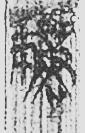{巾單口}
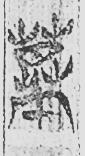幕
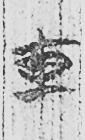車
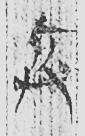兵
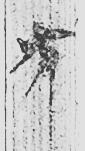犬
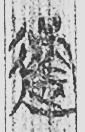{止達}
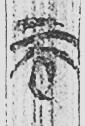而
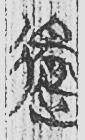還
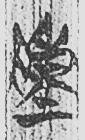陳
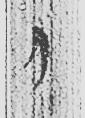人
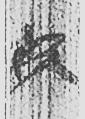𡚦
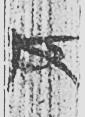反
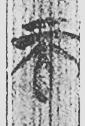而
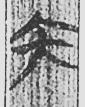內
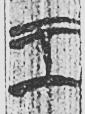王
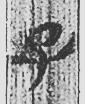子
